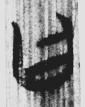曰
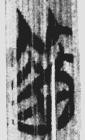昔
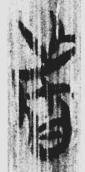者
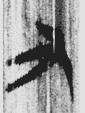又（有）
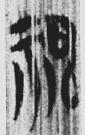神
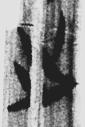之
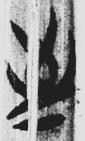至
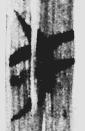于
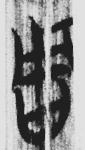周
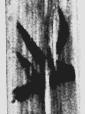之
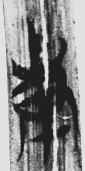東
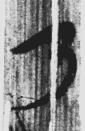乃
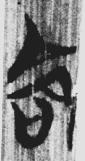命
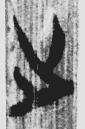之
